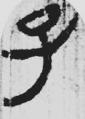子
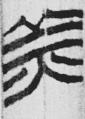羔
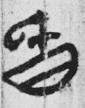昏（問）
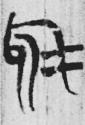於
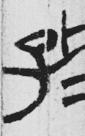孔子
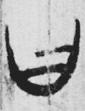曰
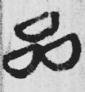厽（三）
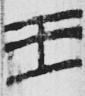王
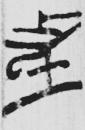者
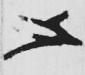之
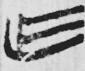乍（作）
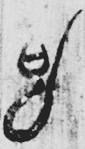也
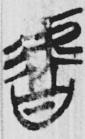{虍皆}（皆）
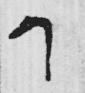人
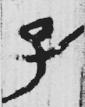子
